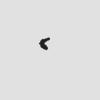子
